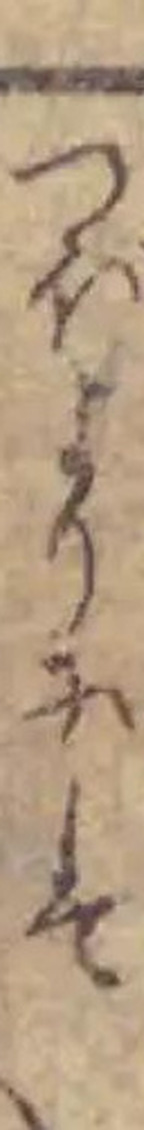つぼよりにして
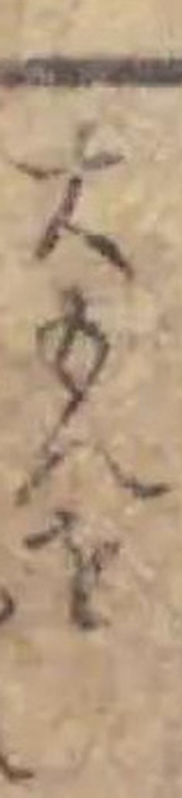大もんを

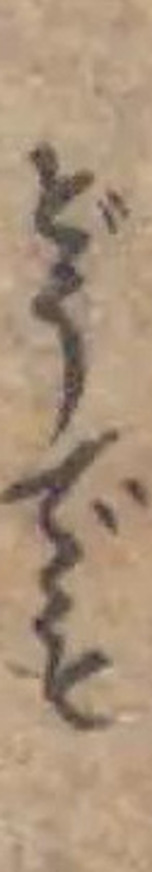どうでも
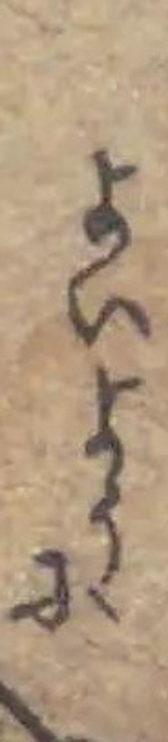よいように
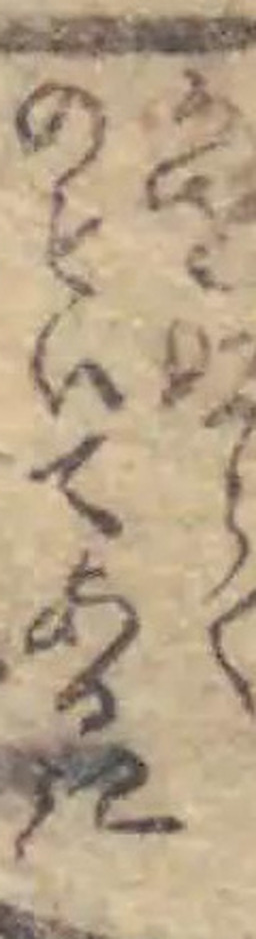のそいてあるき
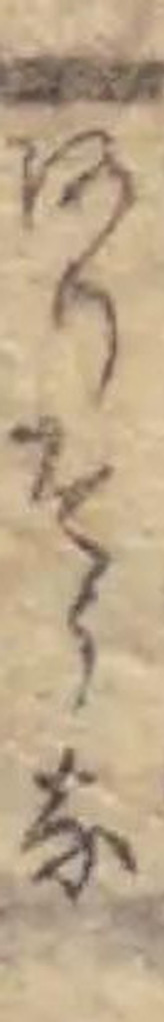ありそうな
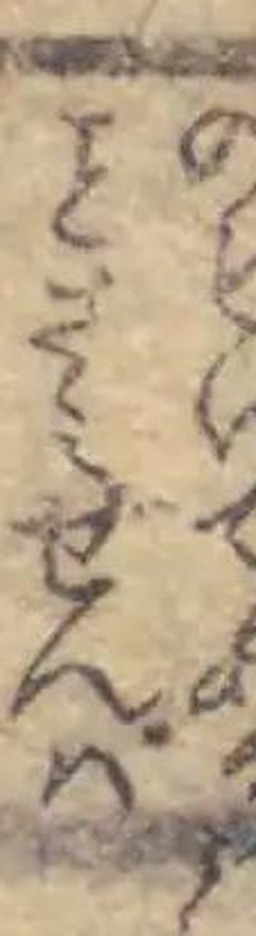ことさミせんハ
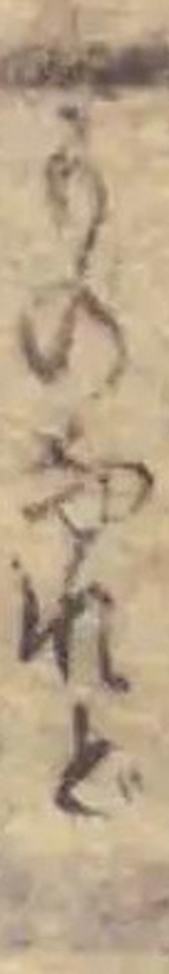ものなれど
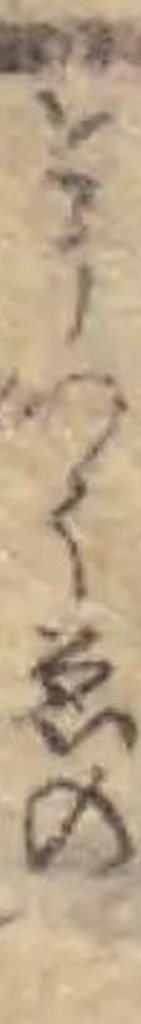とうつくゑの
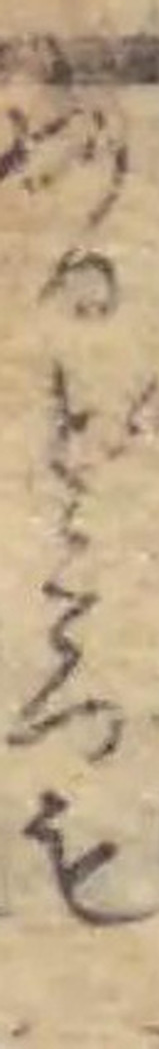あるところも
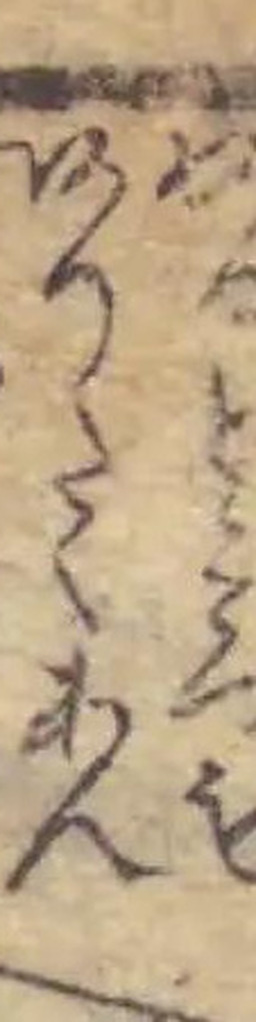ありたくあん
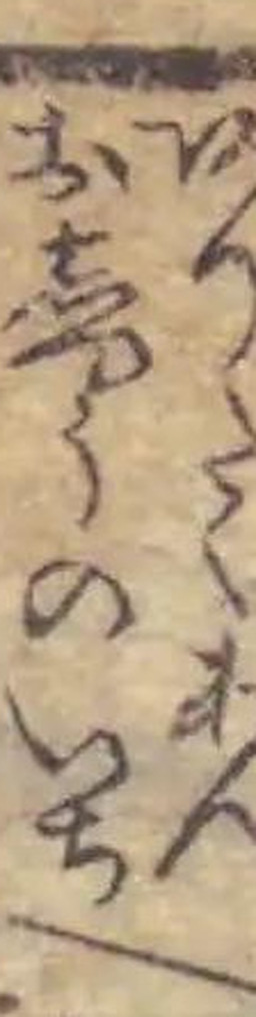おしやうのいち
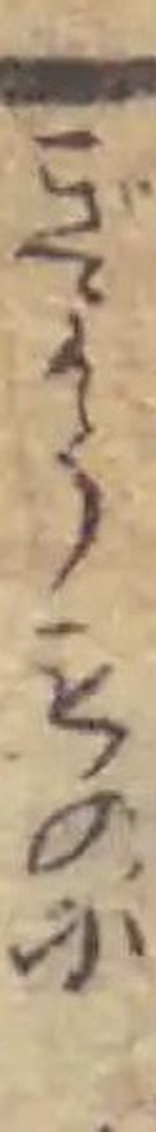ぎようものに
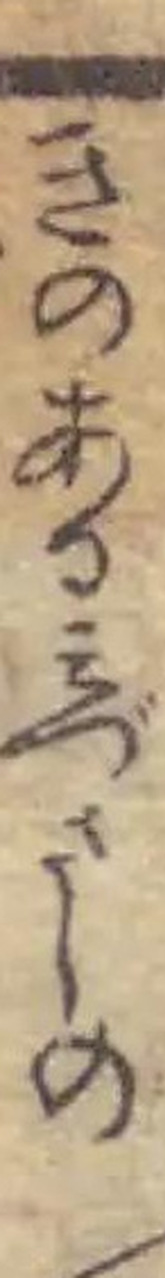きのあるミづさしの
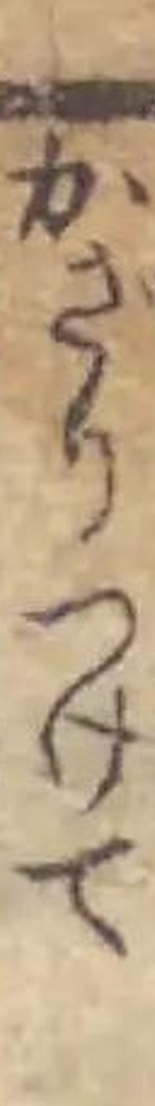かざりつけて
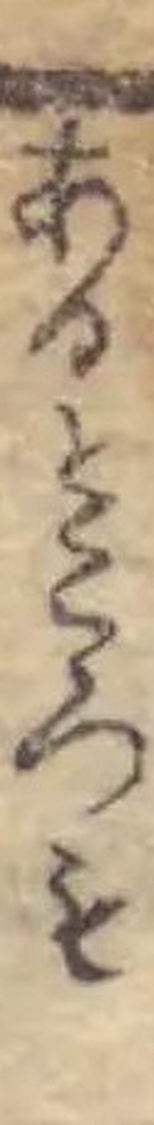あるところも
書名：豆男江戸見物 2巻
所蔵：国立国会図書館 National Diet Library, JAPAN
